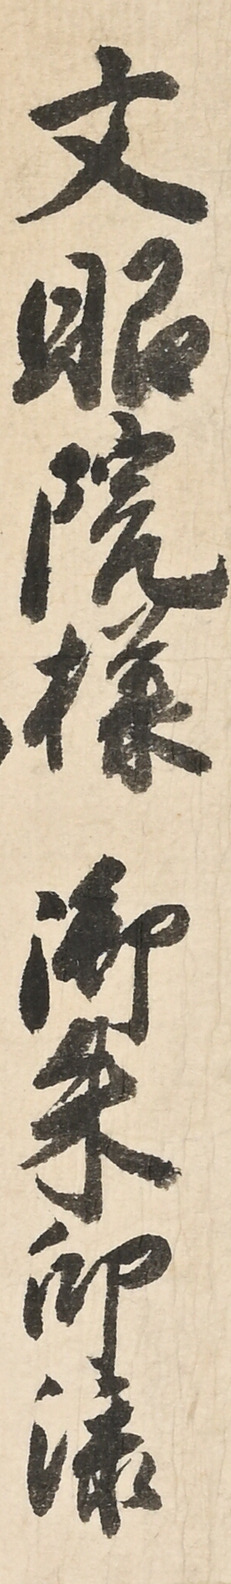文昭院様御朱印添
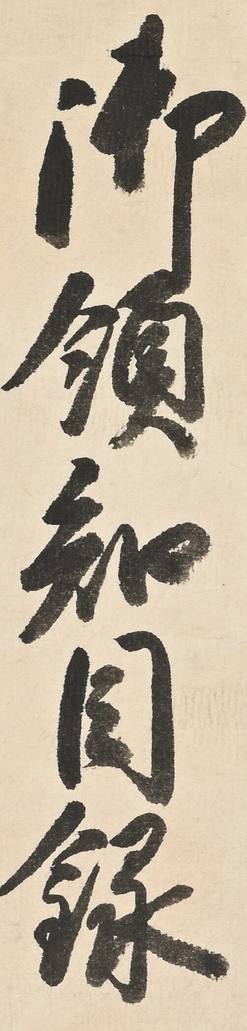御領知目録
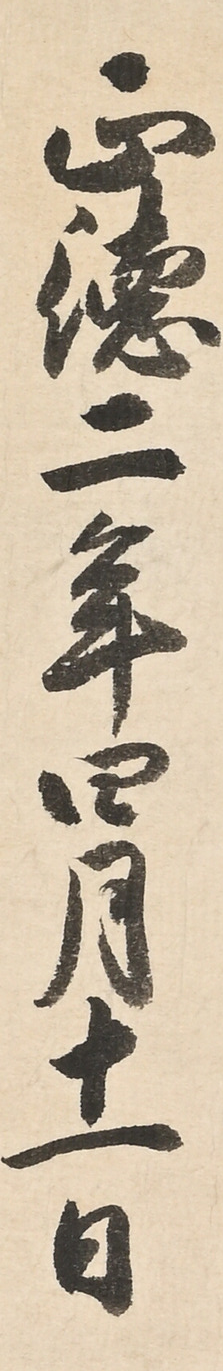正徳二年四月十一日

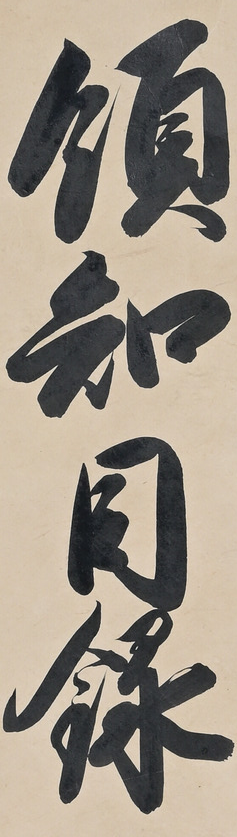領知目録

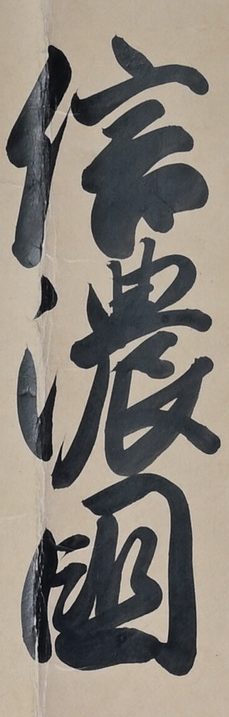信濃国
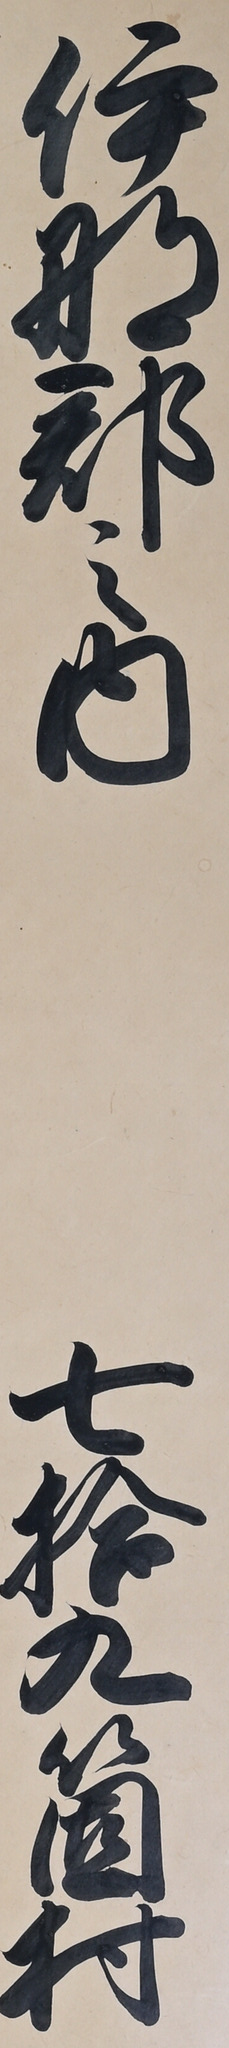伊那郡之内七拾九箇村
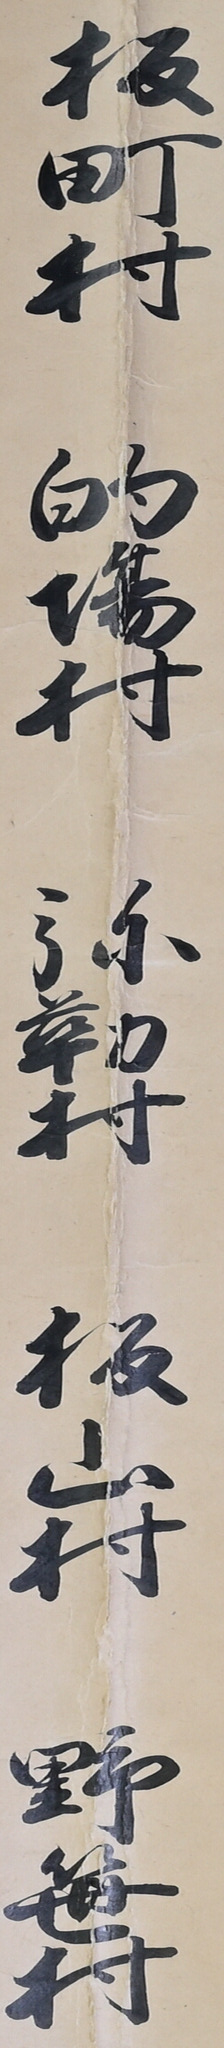板町村的場村弥勒村板山村野笹村
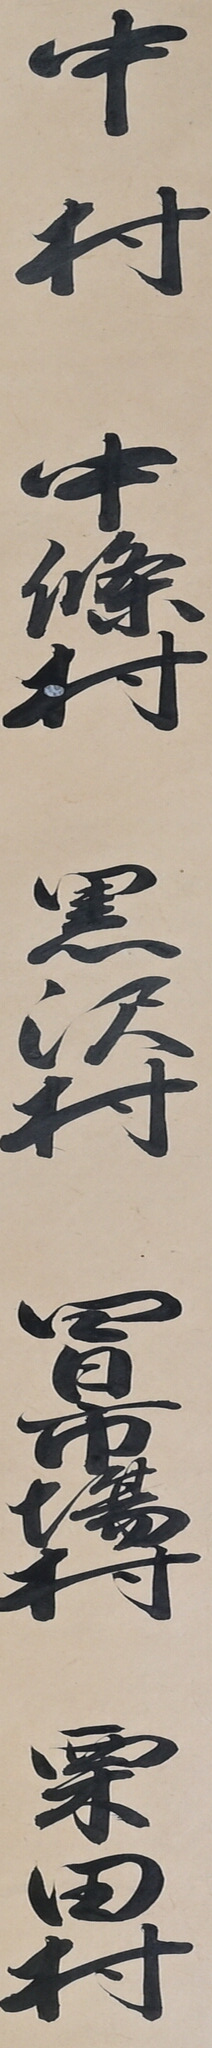中村中條村黒沢村四日市場村栗田村
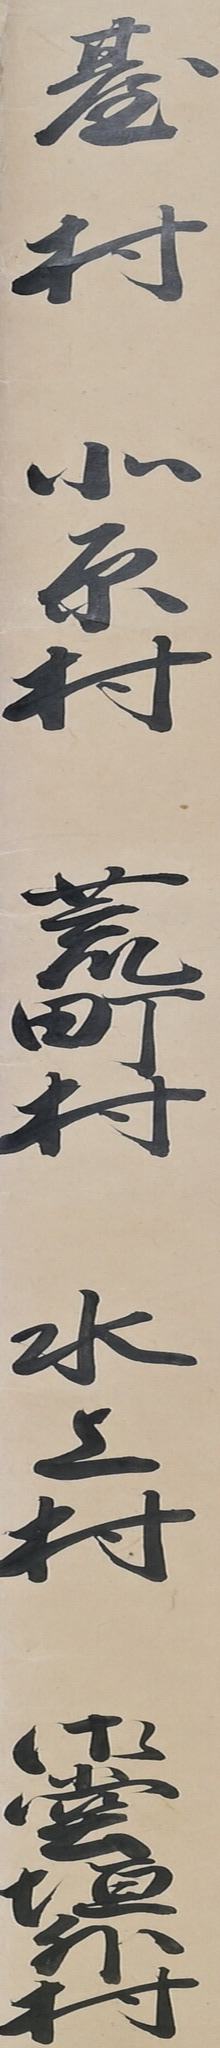台村北原村荒町村水上村御堂垣外村
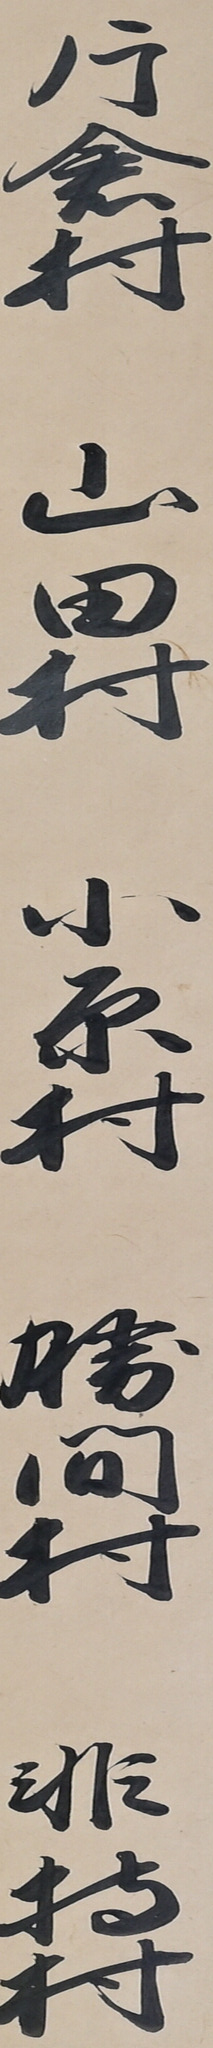片倉村山田村小原村勝間村非持村
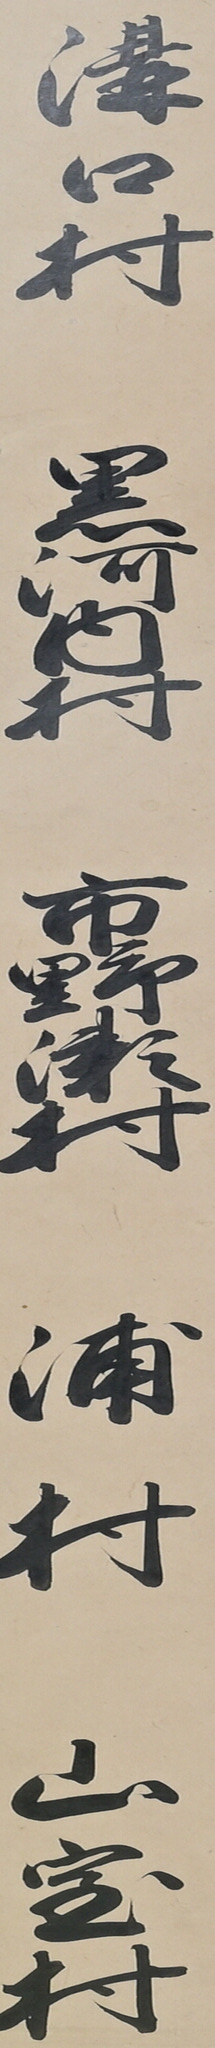溝口村黒河内村市野瀬村浦村山室村
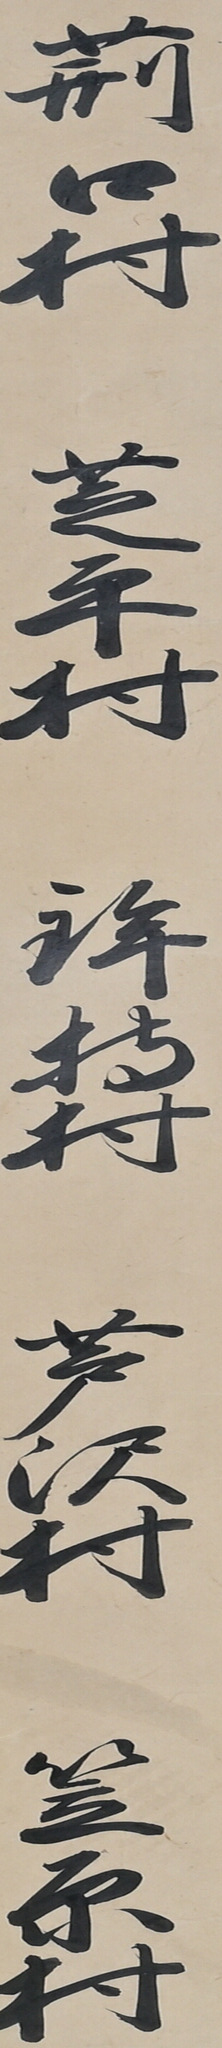荊口村芝平村鉾持村芦沢村笠原村
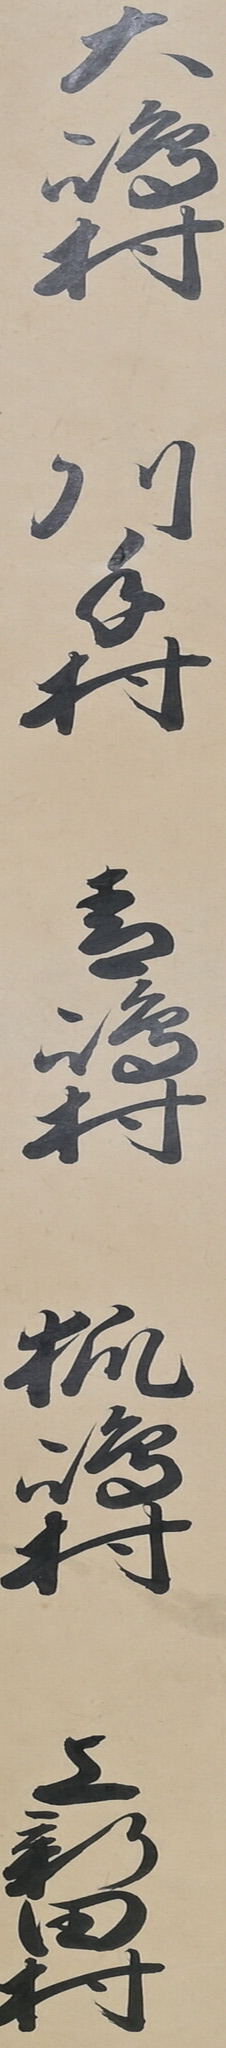大嶋村川手村青嶋村狐嶋村上新田村
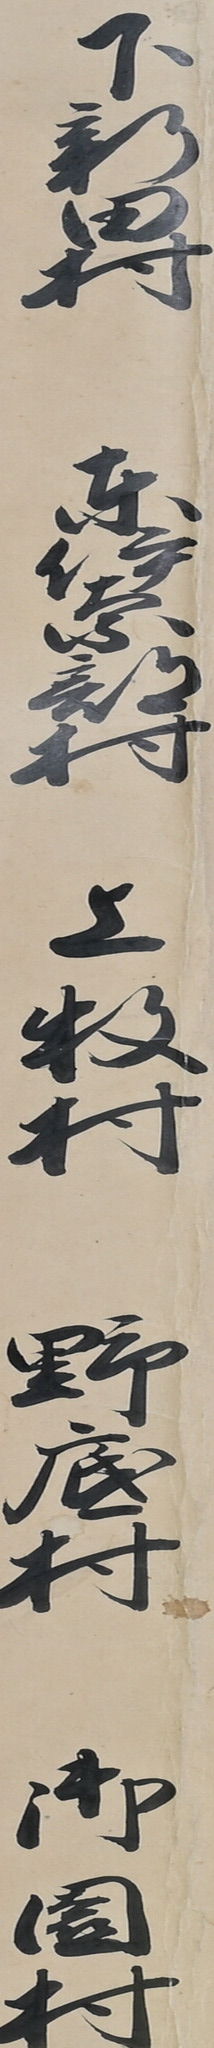下新田村東伊奈部村上牧村野底村御園村
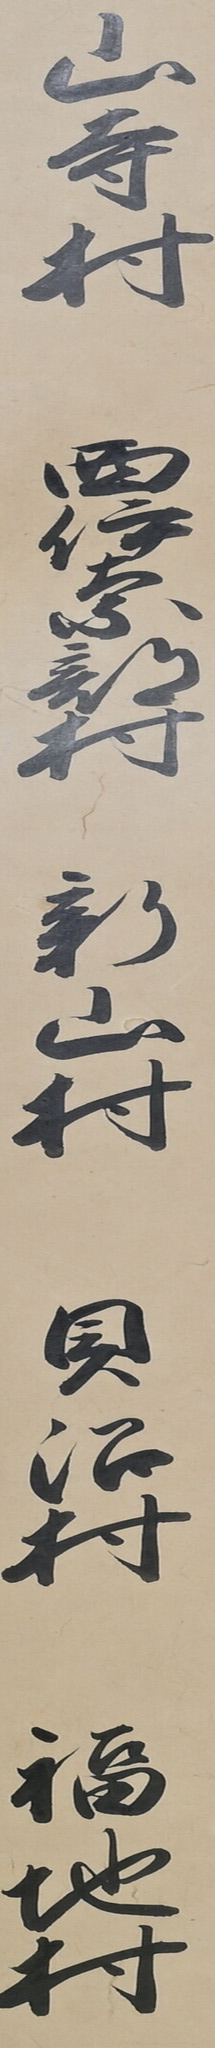山寺村西伊奈部村新山村貝沼村福地村

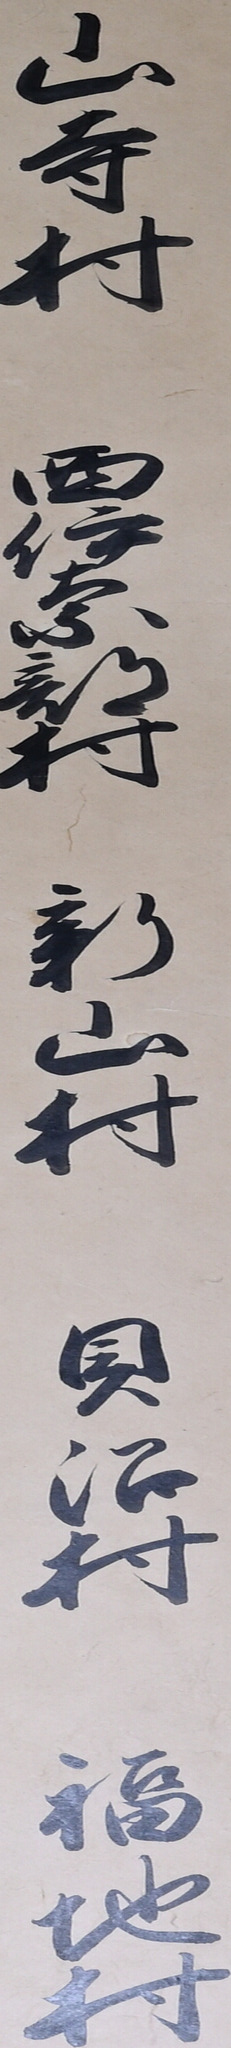山寺村西伊奈部村新山村貝沼村福地村
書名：御領地目録
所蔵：伊那市立高遠町図書館・合同会社AMANE
